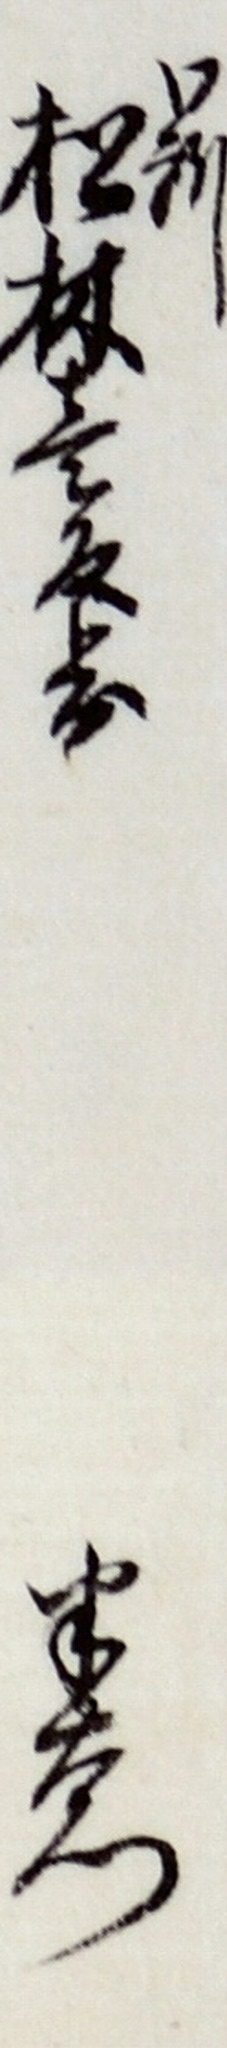松林壱反歩半右衛門
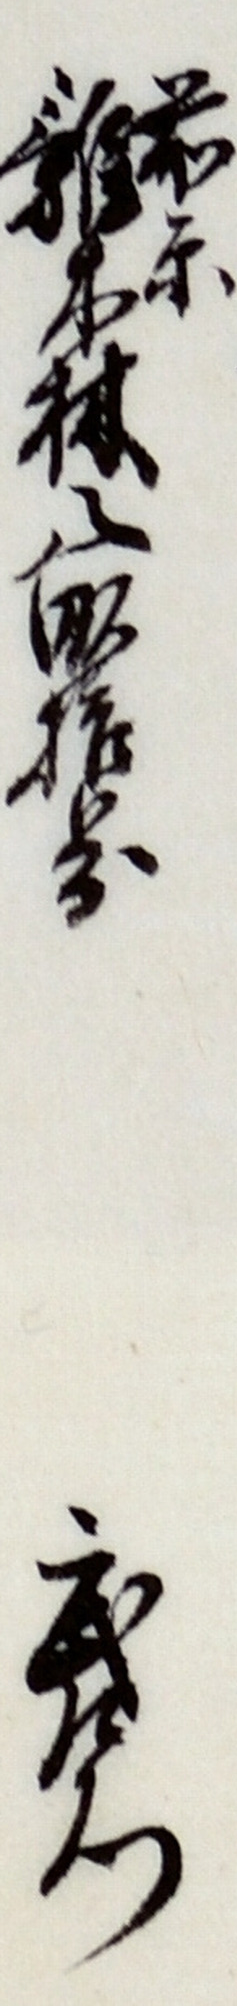雑木林八畝拾歩武左衛門
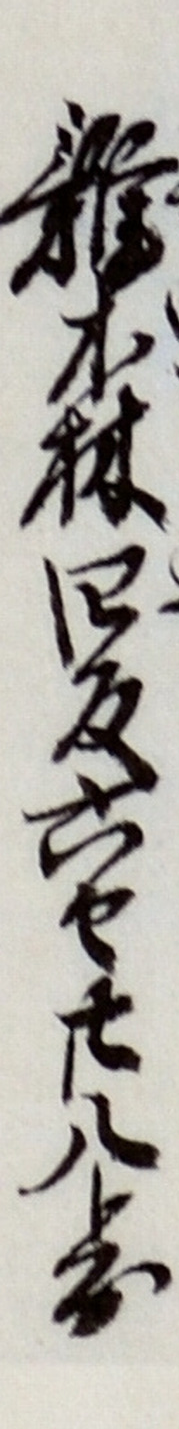雑木林四反六セ廿八歩同断
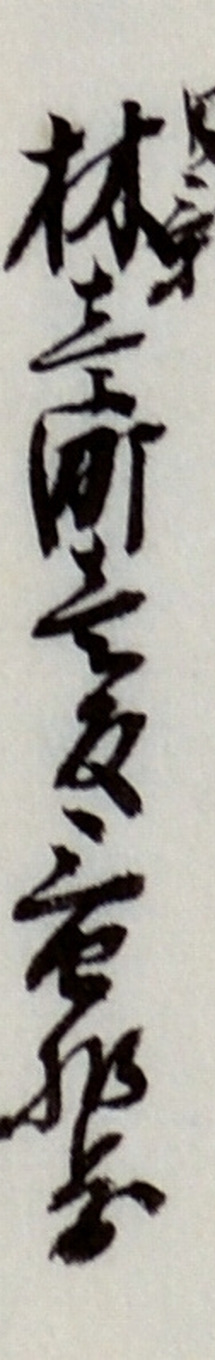林壱町壱反三セ拾歩同寺

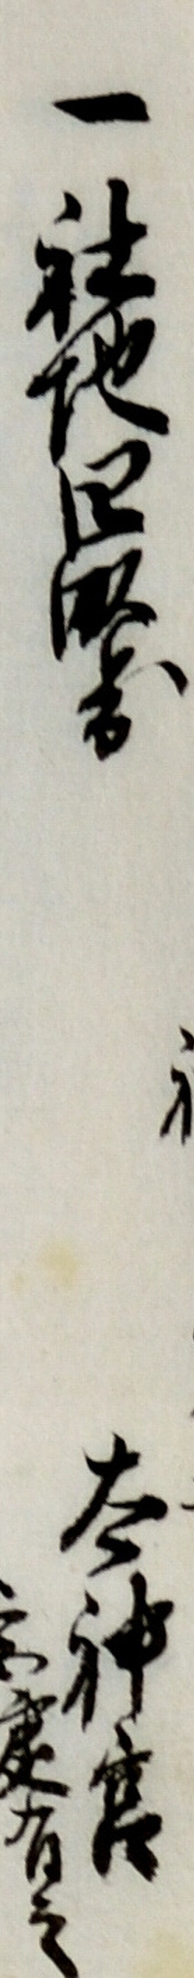一社地四畝歩太神宮
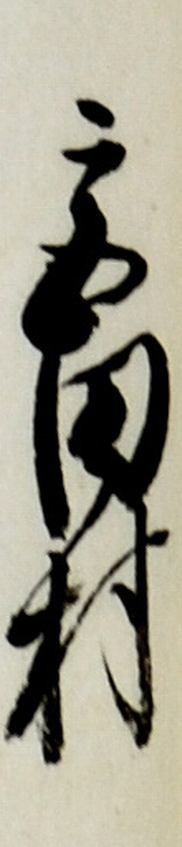宮田村
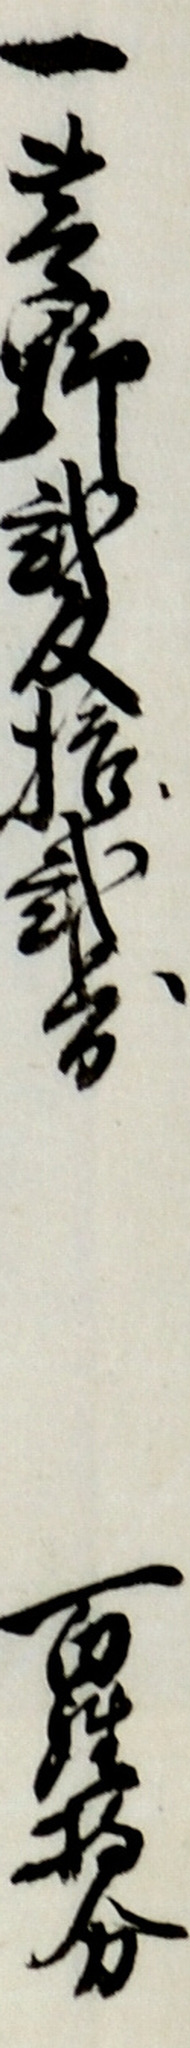一芝野弐反拾弐歩百姓持分
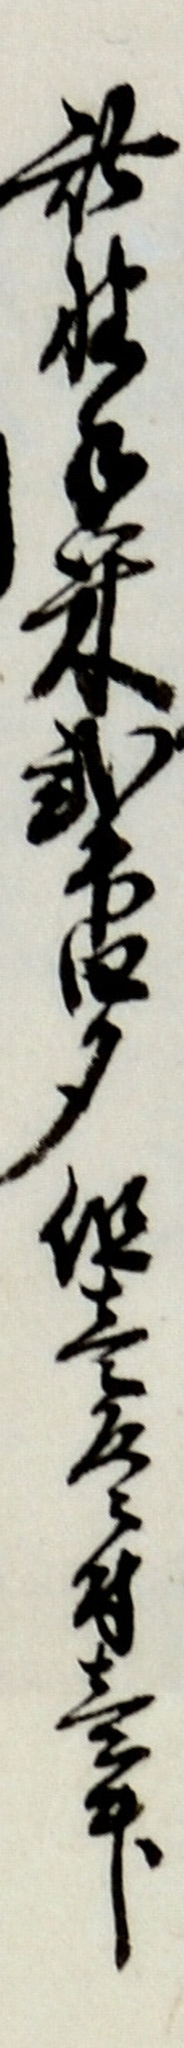此野手米弐升四勺但壱反ニ付壱升
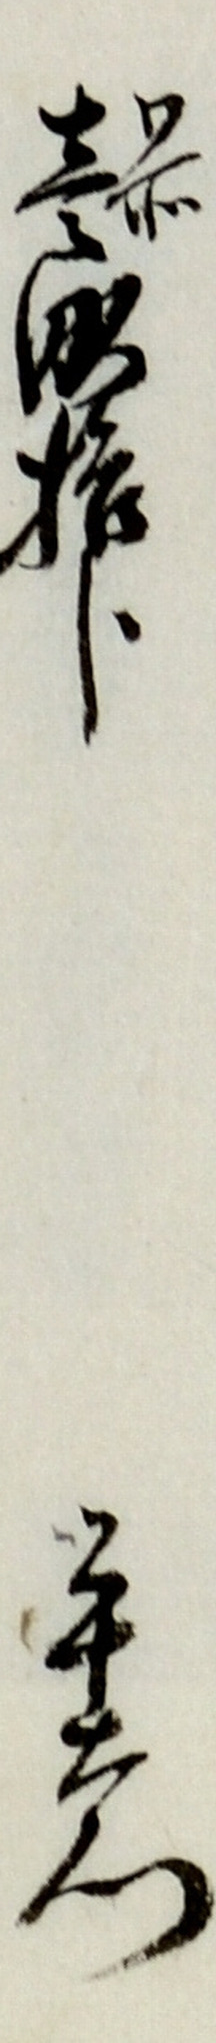壱畝拾歩平右衛門
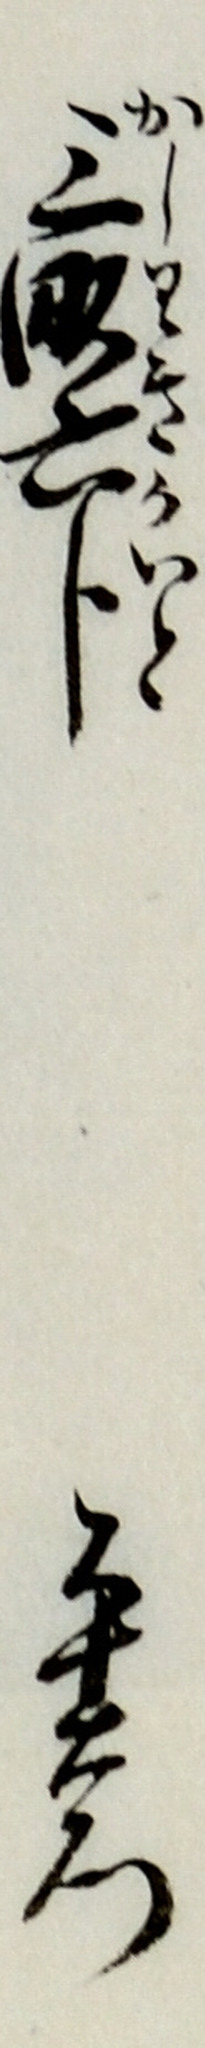三畝六歩平右衛門
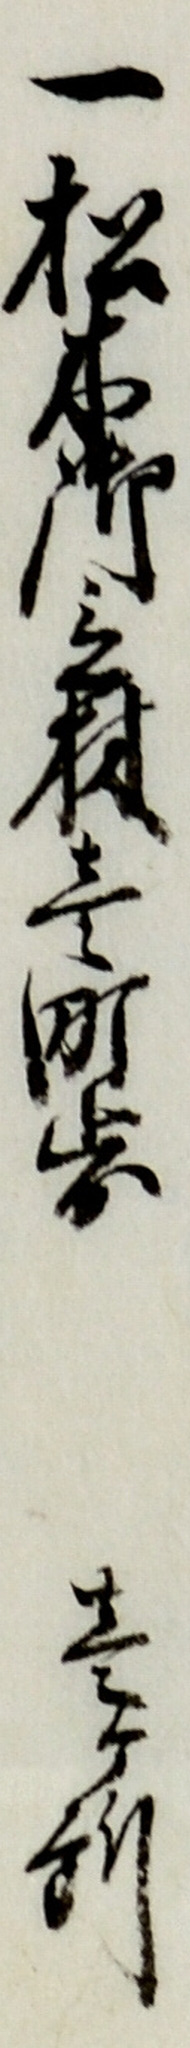一松木御立林壱町歩壱ケ所
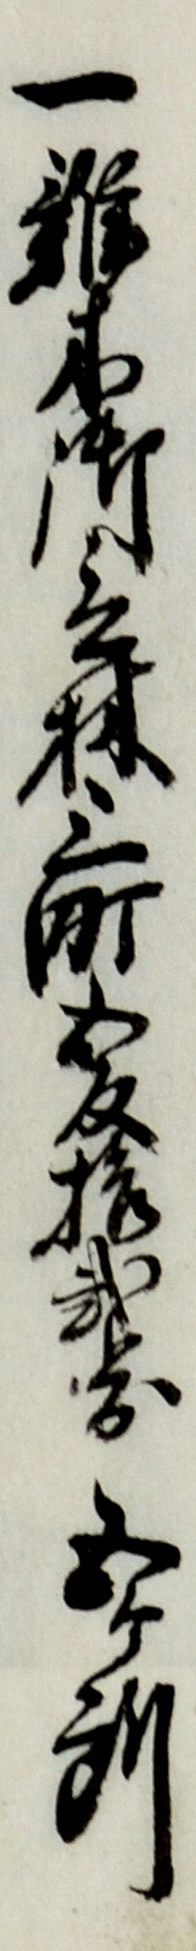一雑木御立林三町五反拾弐歩五ケ所
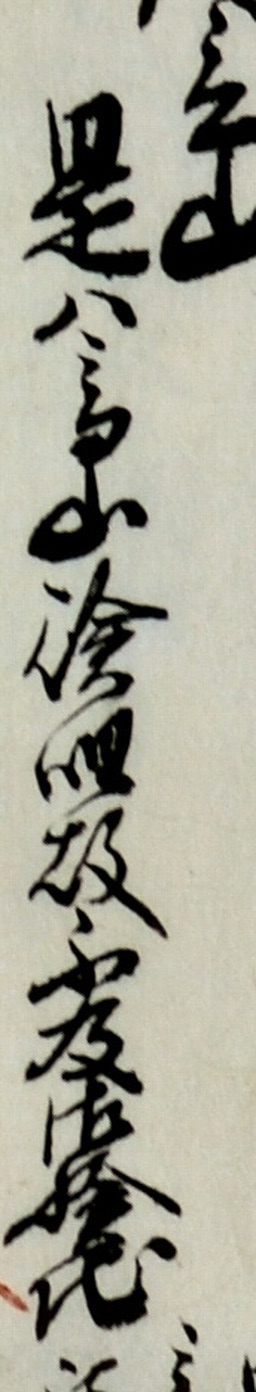是ハ高山嶮岨故不及御検地

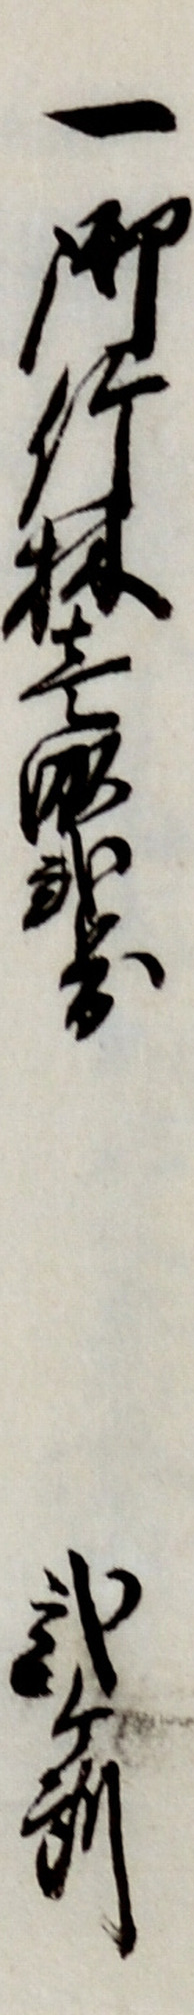一御竹林壱畝弐歩弐ケ所
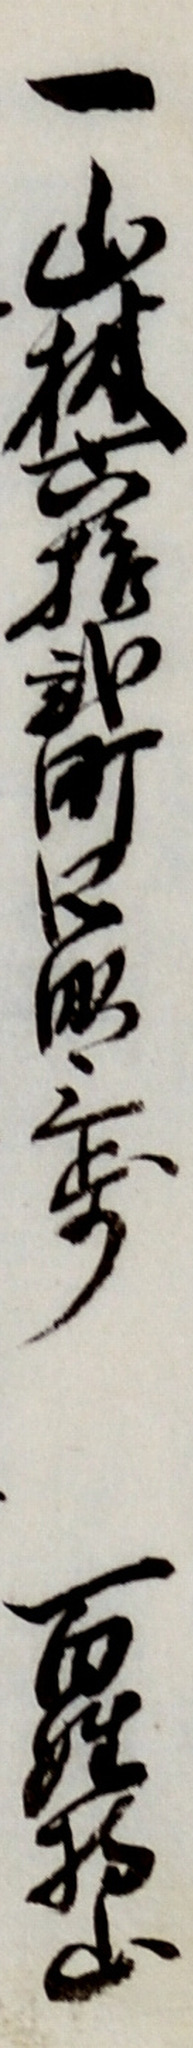一山林六拾弐町四畝三歩百姓持山
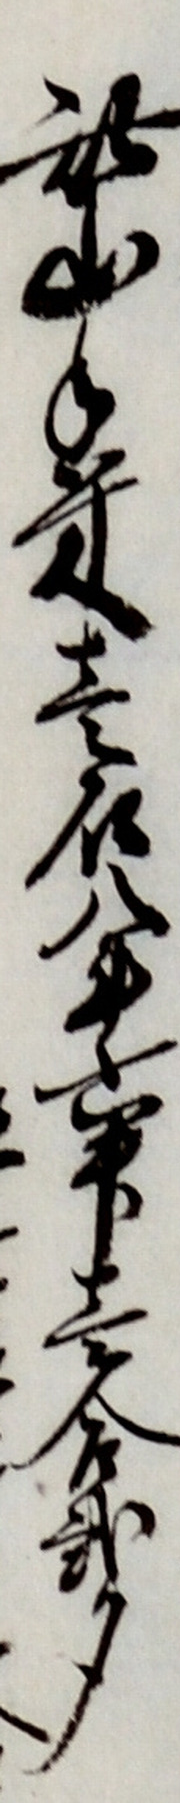此山手米壱石八斗六升壱合弐勺
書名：御領分中山林社地手控
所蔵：伊那市立高遠町図書館・合同会社AMANE
